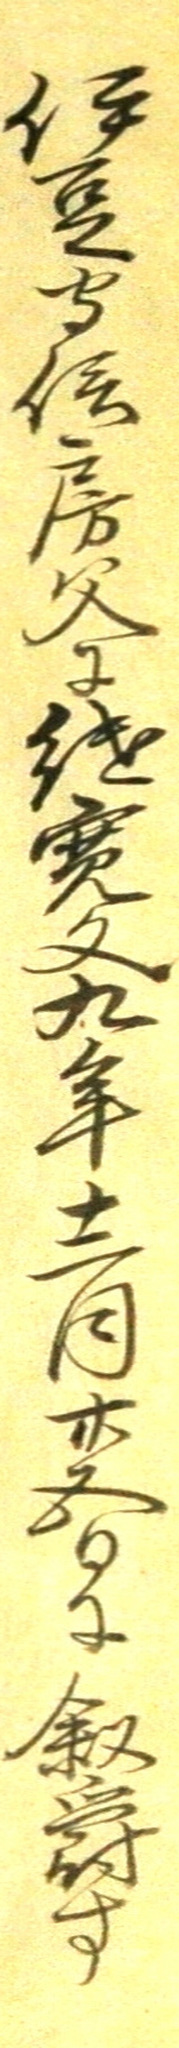伊豆守信房父に継寛文九年十二月廿五日に叙爵す
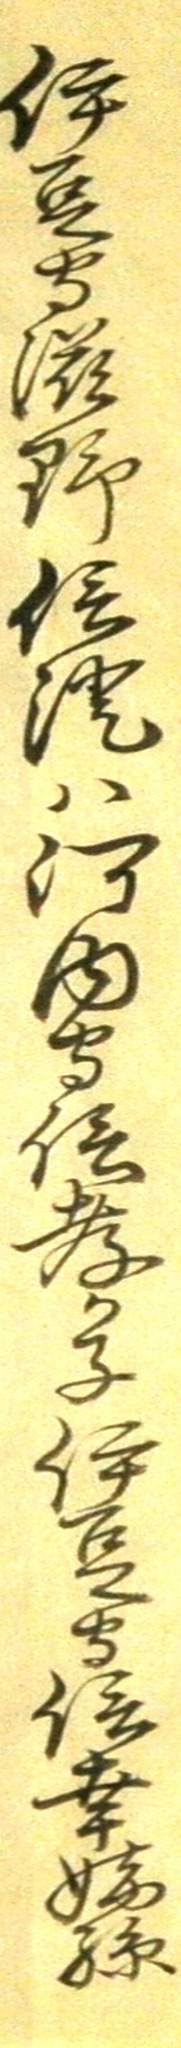伊豆守滋野信澄は河内守信孝か子伊豆守信幸嫡孫
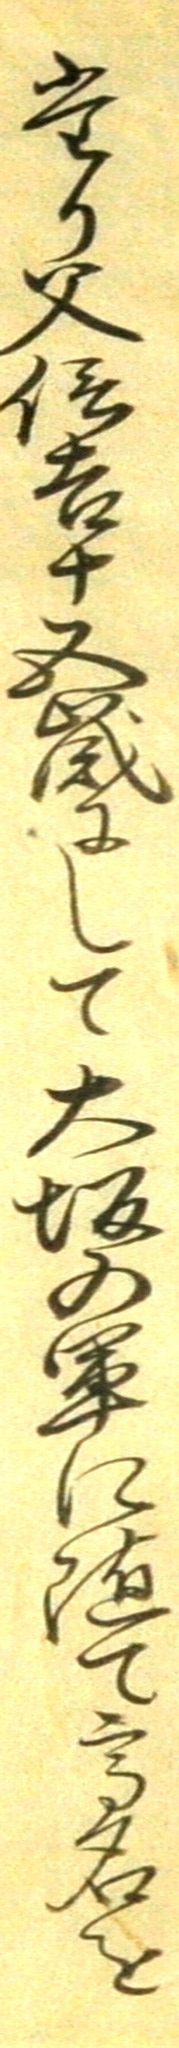たり父信吉十五歳にして大坂の軍に随て高名を
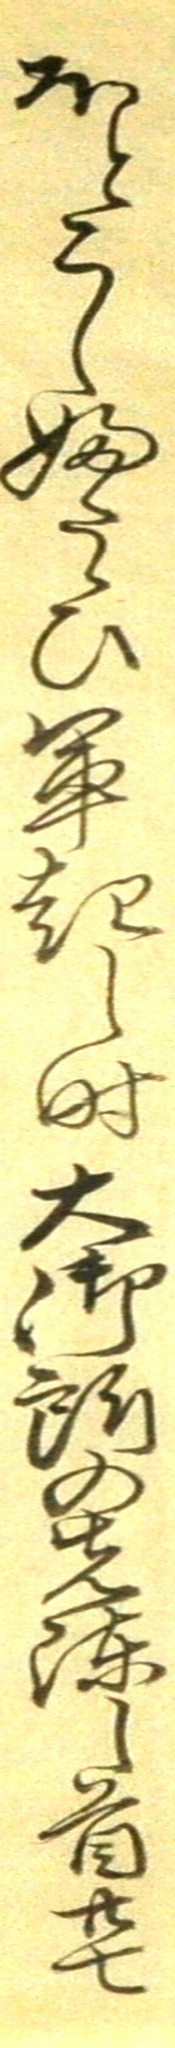ほとこしふたゝひ軍起し時大御所の先陣し首廿七
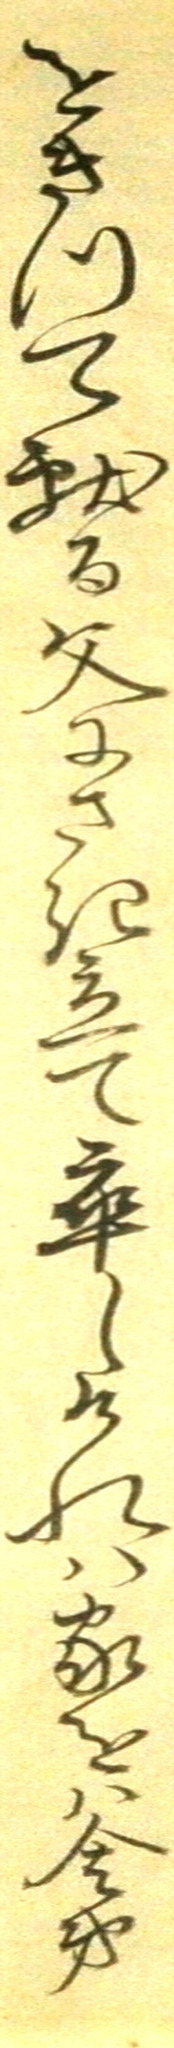をきつて献る父にさき立て卒しけれは家をは舎弟
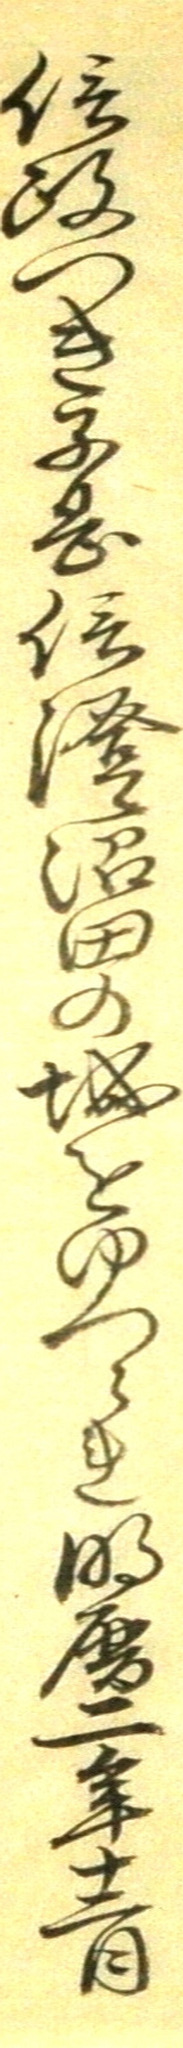信政つき子息信澄沼田の城をゆつられ明暦二年十二月
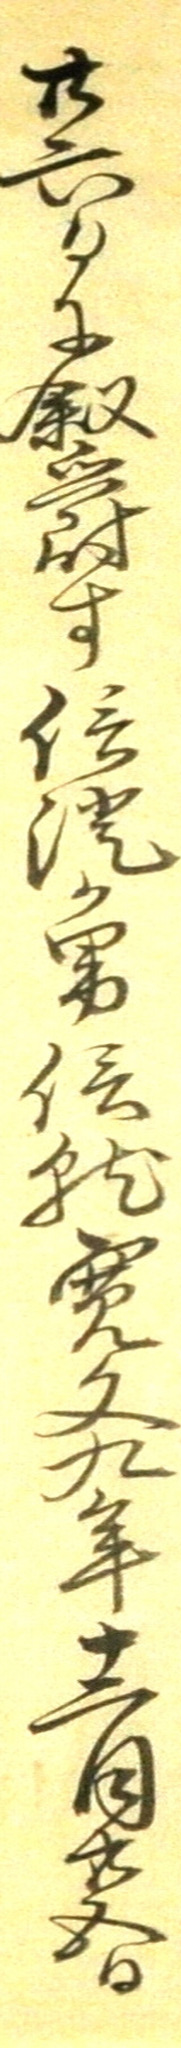廿六日に叙爵す信澄か男信就寛文九年十二月廿五日
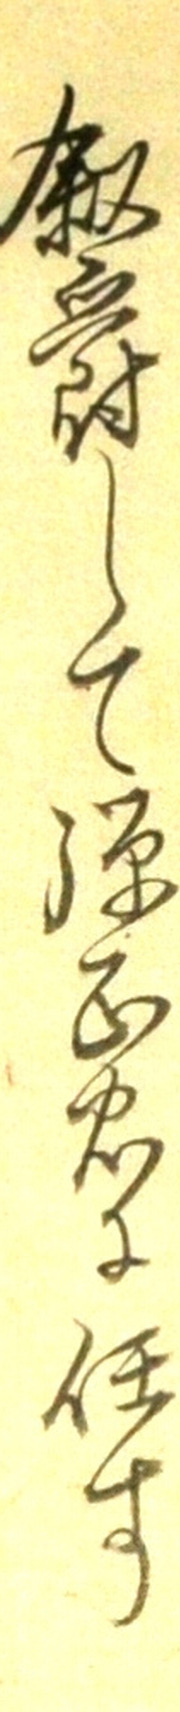叙爵して弾正忠に任す
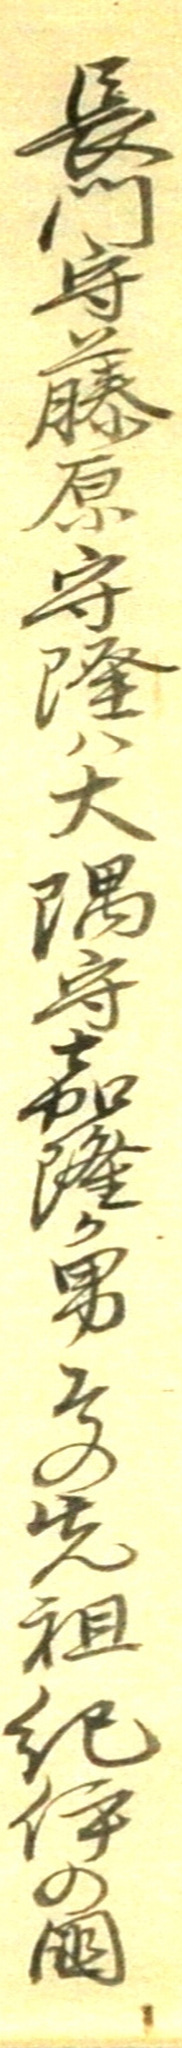長門守藤原守隆は大隅守嘉隆か男その先祖紀伊の国
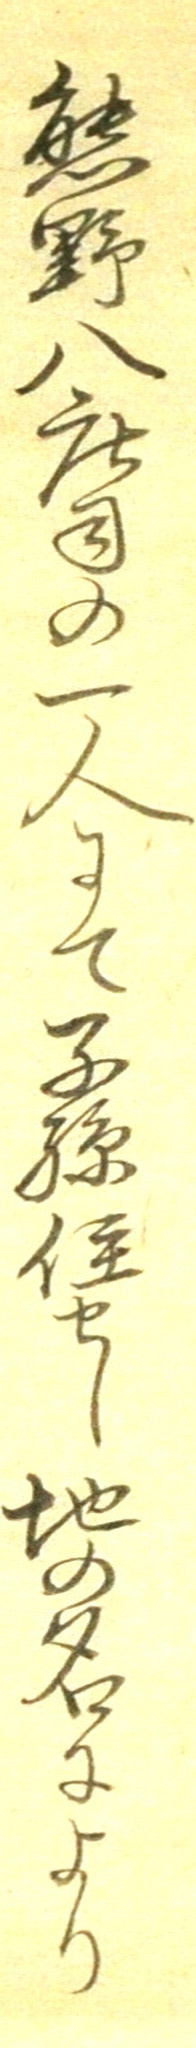熊野八庄司の一人にて子孫住せし地の名により
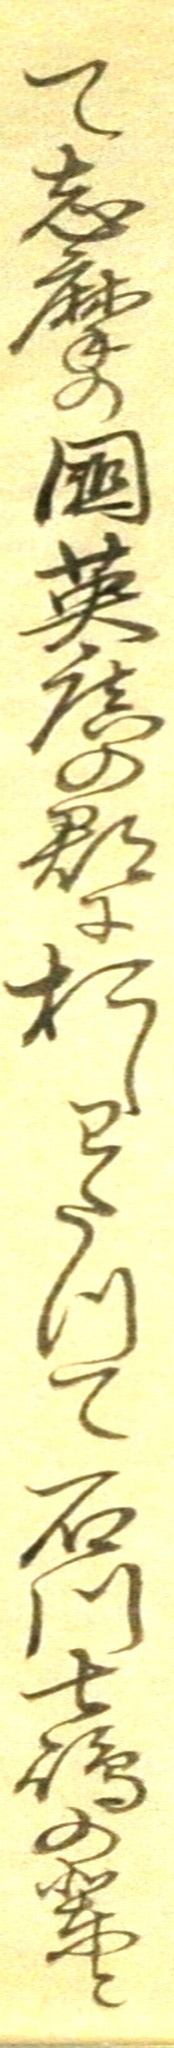て志摩の国英虞の郡におしわたつて石川七島の輩と
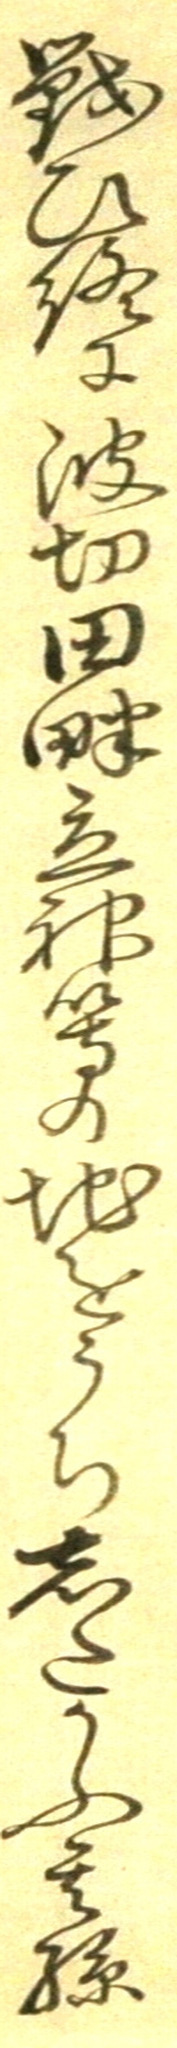戦ひ終に波切田畔立神等の地をうちしたかふ其孫
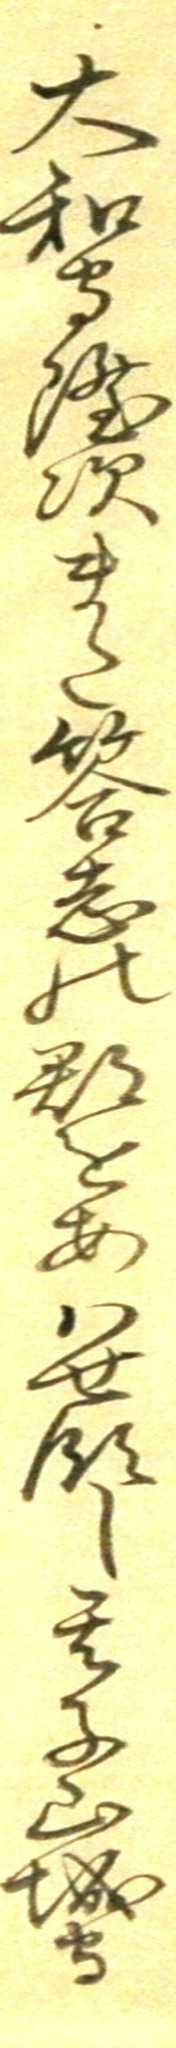大和守隆次また答志の郡をあはせ領し其子山城守
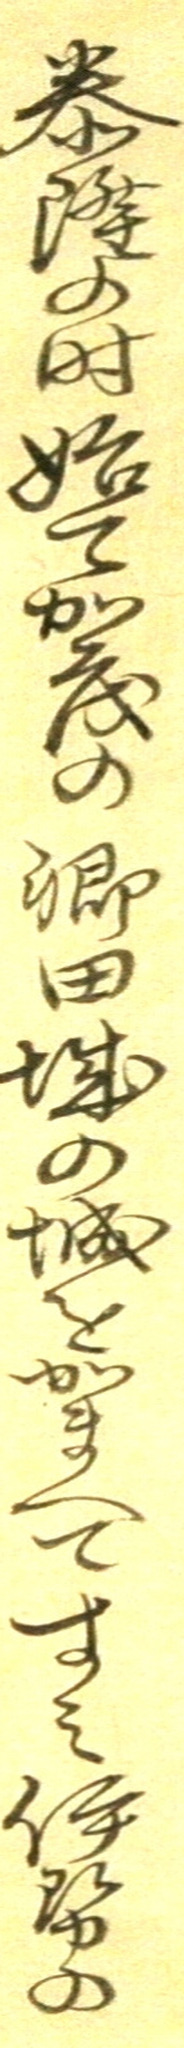泰隆の時始て加茂の郷田城の城をかまへてすみ伊勢の
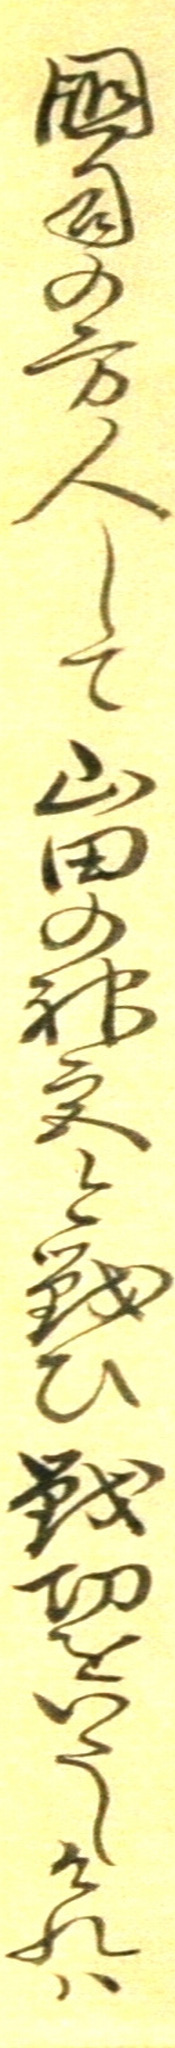国司の方人して山田の神宮と戦ひ戦功をいたしけれは

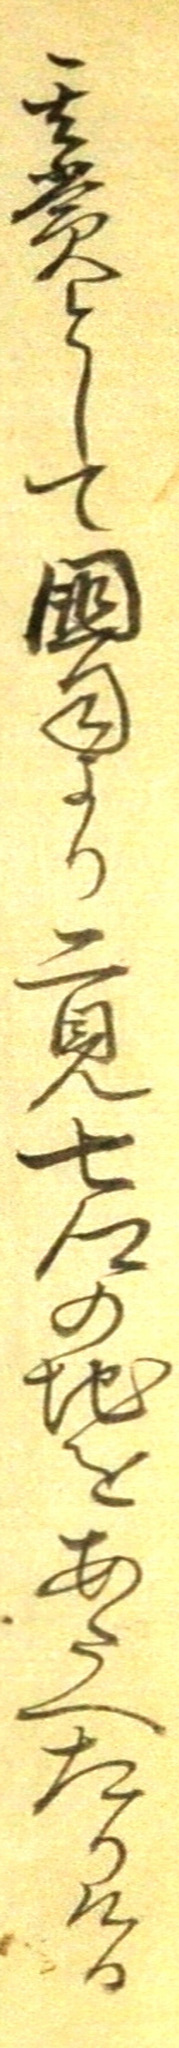其賞として国司より二見七郷の地をあたへたりける
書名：藩翰譜（九・上）
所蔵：伊那市立高遠町図書館・合同会社AMANE
